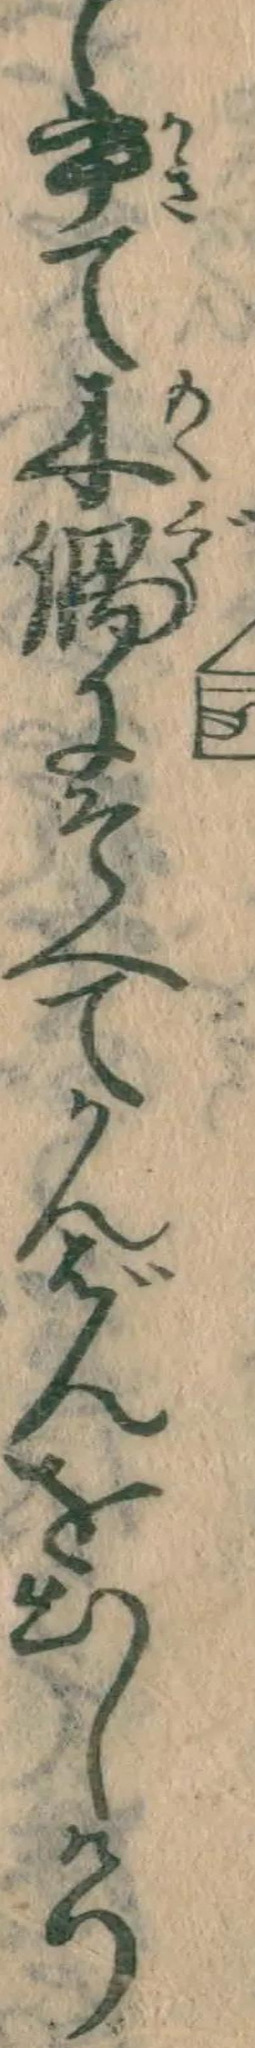と書て木偶にそへてかんばんを出しけり
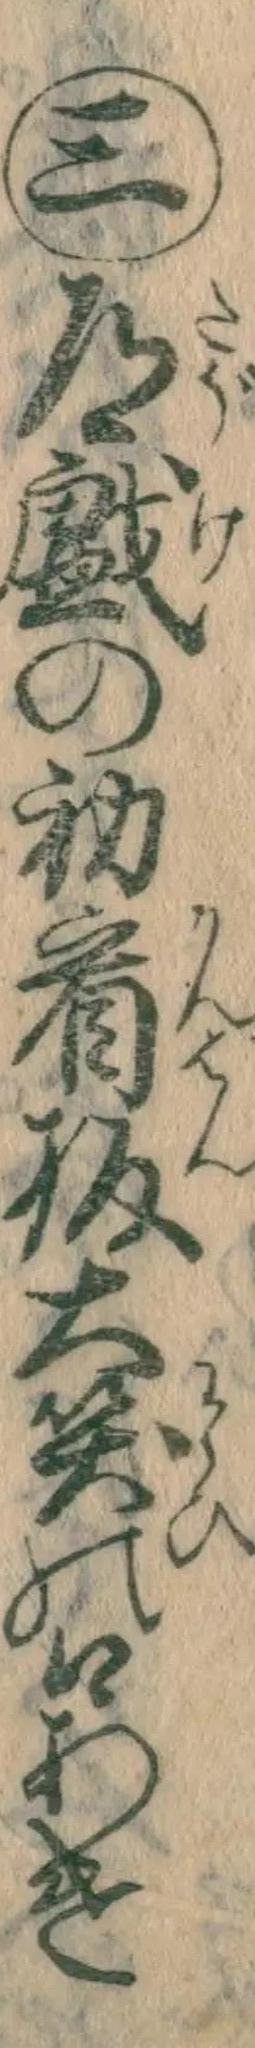三道戯の初看板大笑の口あけ
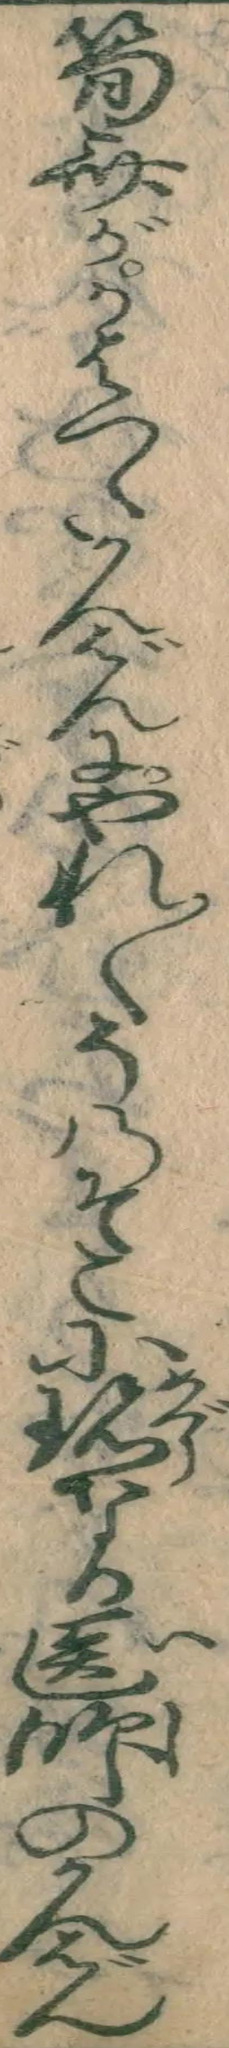筍斎が。かはつたかんばんに。やれ〳〵かのそこに珍なる医師のかんばん
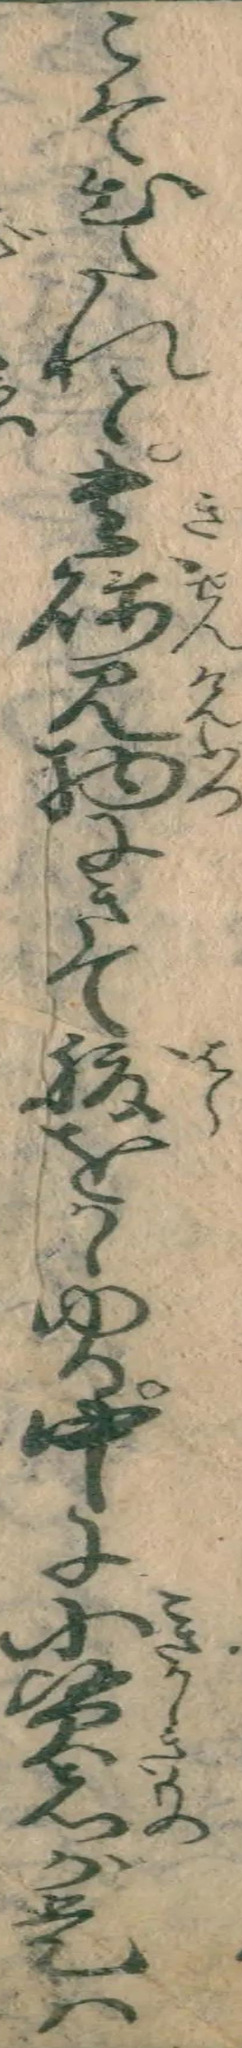こそ出たれと。貴賎見物にきて腹をかゝゆる。中に小賢者が是は
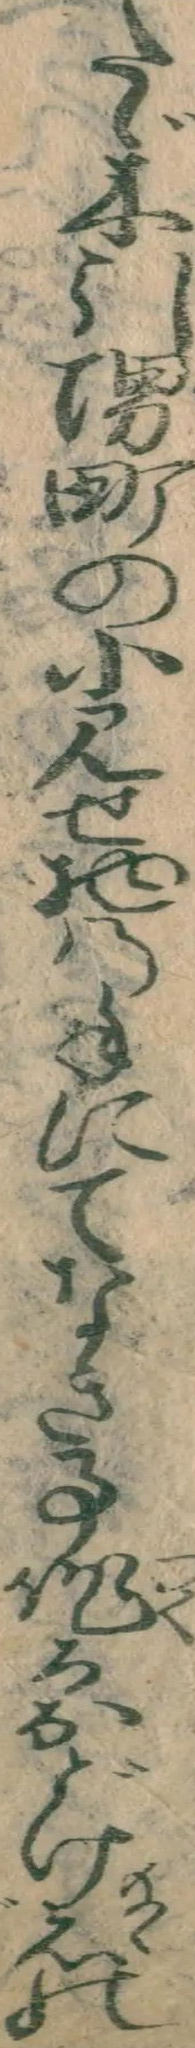たゞ木引堺町の小見せ物の手にてなき事作るおどけ者の
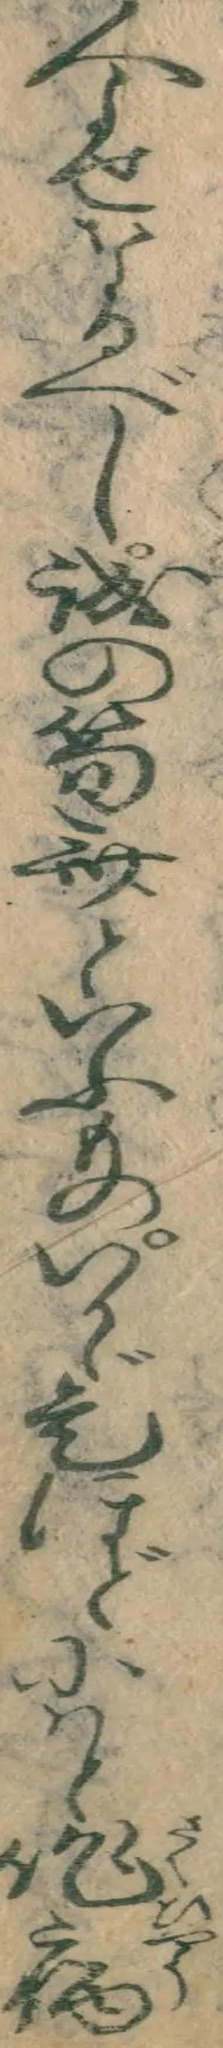人よせなるべし。誠の筍斎といふもの。いかゞ是ほどにはと作病

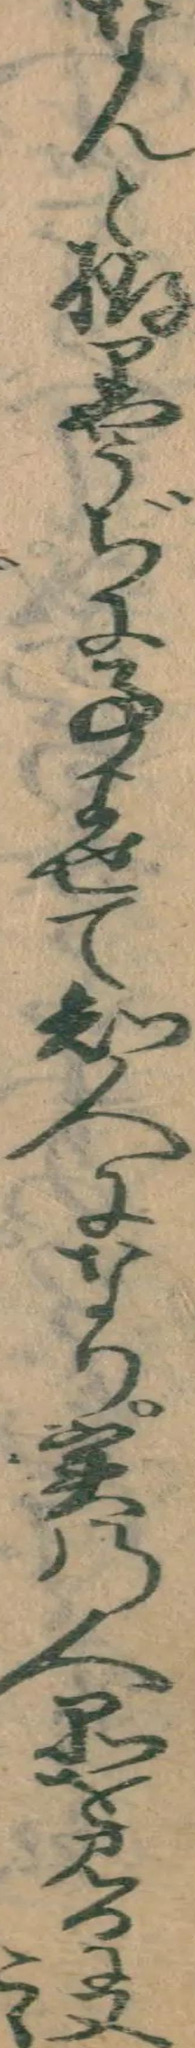なんと拵りやうぢに事よせて知人になり。実の人品を見るに又こら
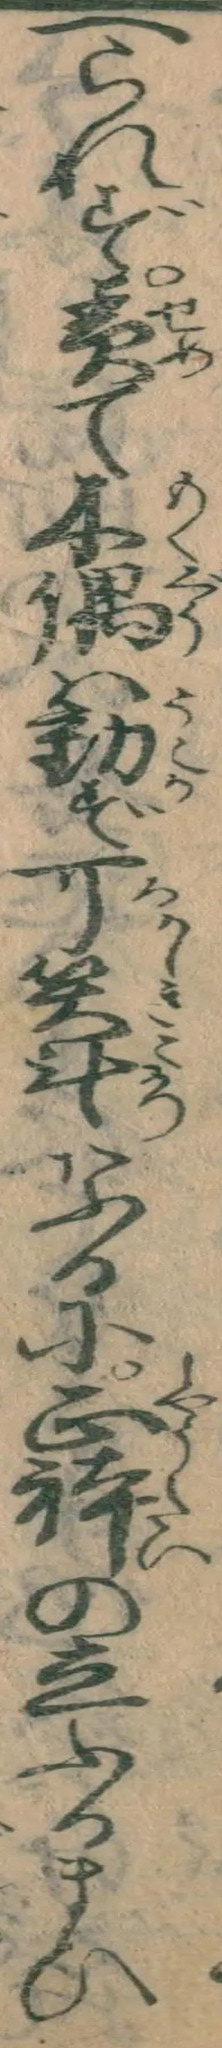へられず。責て木偶は動ず可笑計なるに。正体の立ふるまひ
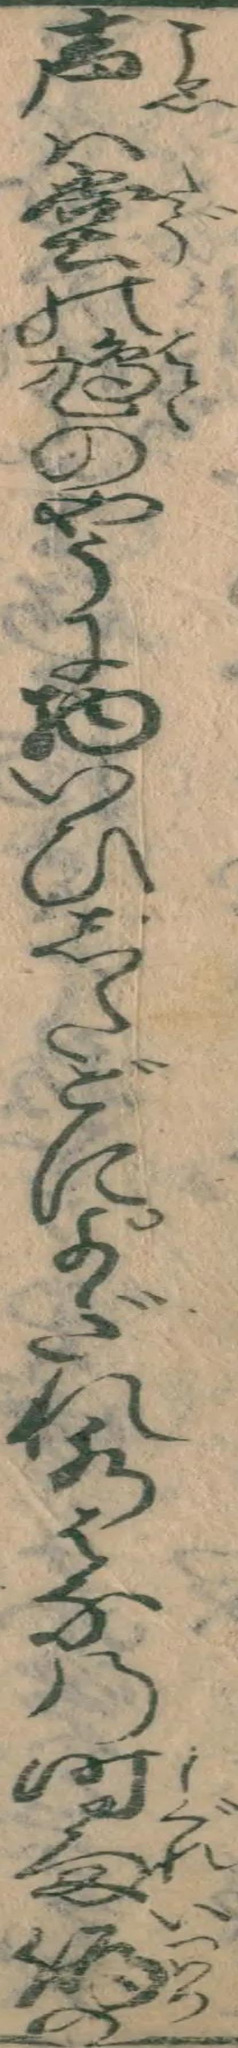声は堂の鳩のやうに物いひしたどに。よだれ水はなの時雨偽の
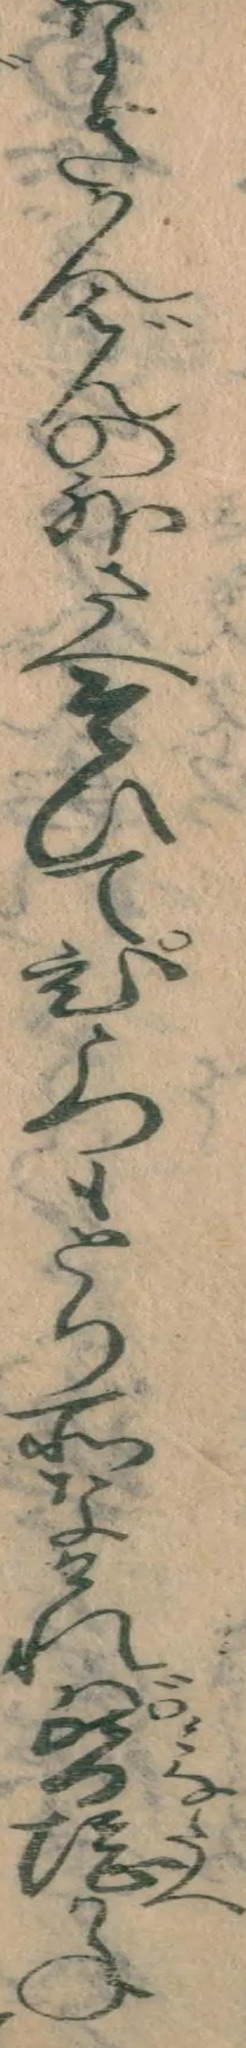なきかんばんの外さへそひて。ひとつもとり所なければ。皆堪かねて
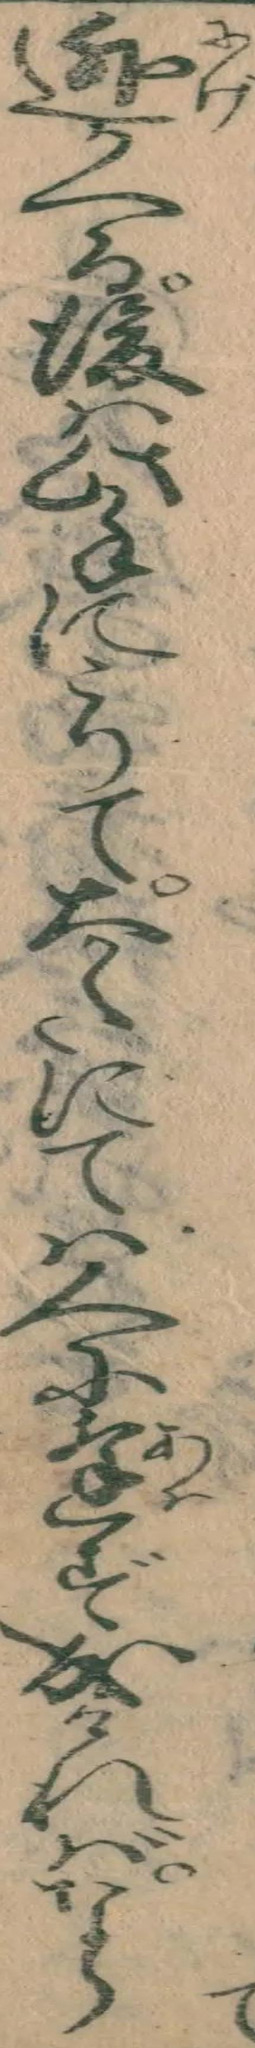逃かへる。後は此手にこりて。大かたにては人に逢ず成ければ。なら
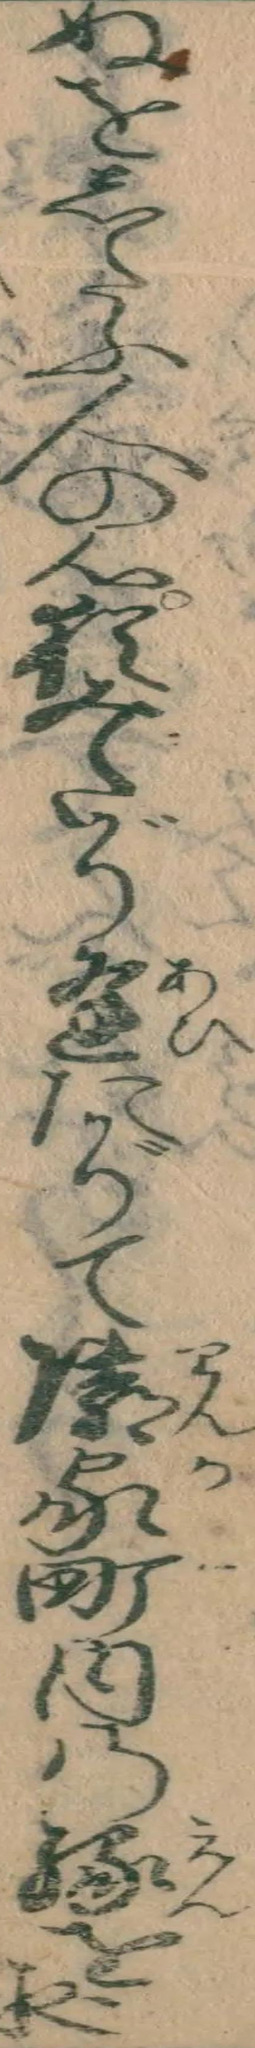ぬをしたふ人の心。猶みたがり逢たがりて隣家町内の縁を求
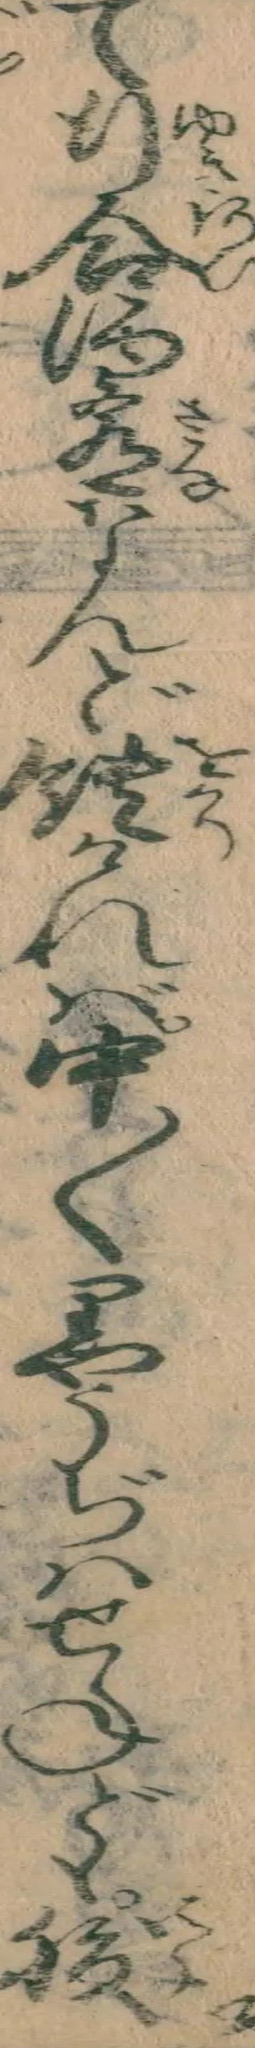て行合酒肴なんど饋ければ。中々りやうぢはせねども。腹
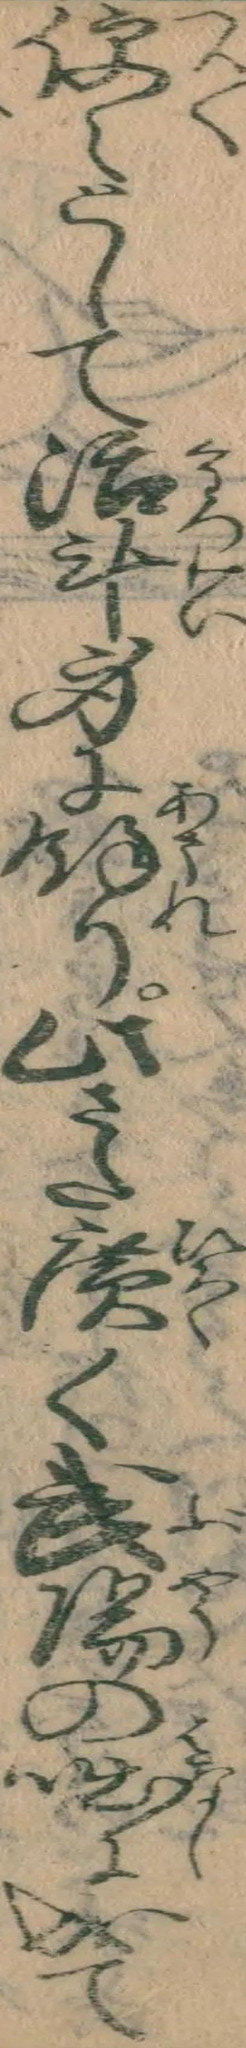便々として活計身に余り。此さた広〳〵武陽の咄に成て
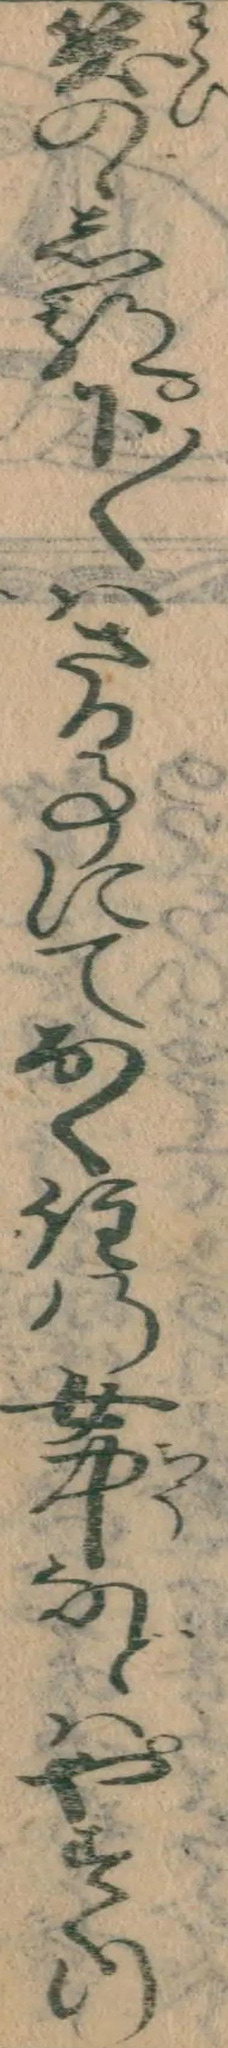笑のゝしる。下々はさる事にておく住の女中などは。やすく行
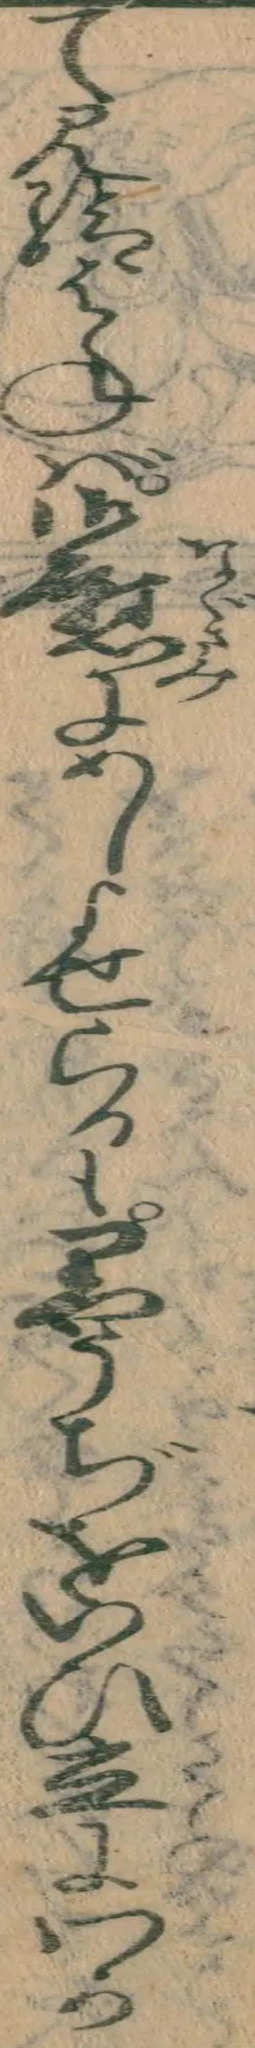て見給はねば。御慰にめしよせらるも。りやうぢをいひ立にわか
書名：新竹斎 5巻
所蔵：国立国会図書館 National Diet Library, JAPAN
